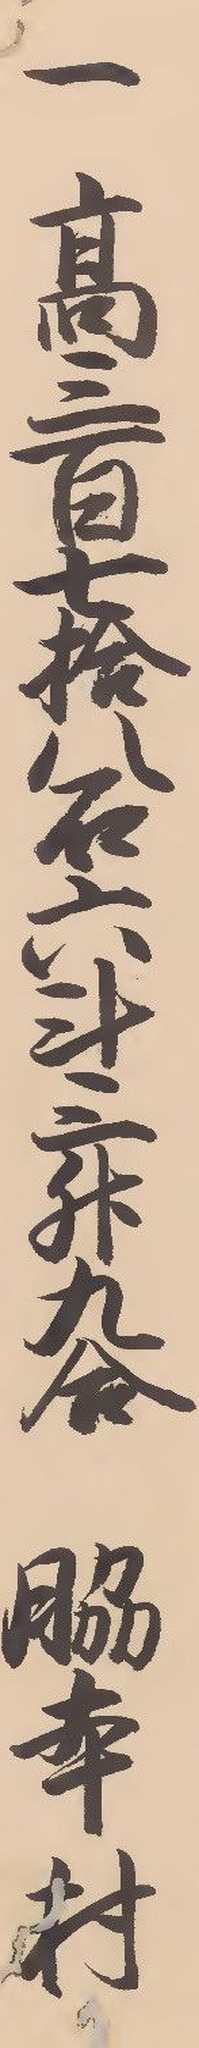一高三百七拾八石六斗三升九合脇本村
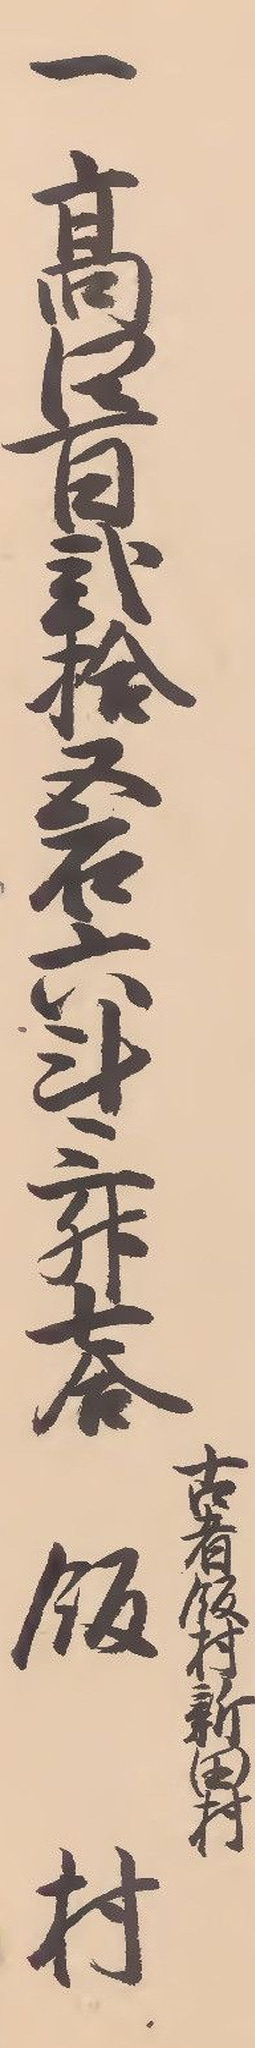一高四百弐拾五石六斗三升七合飯村

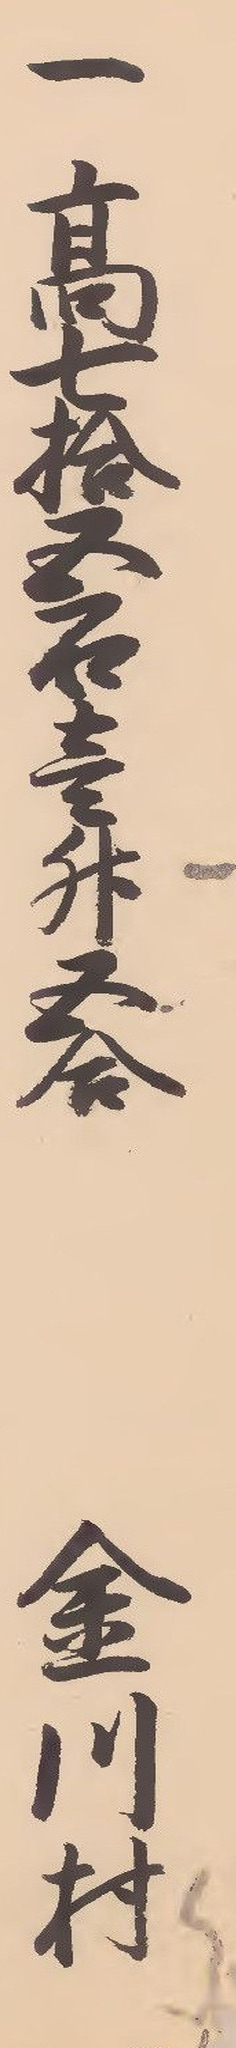一高七拾五石壱升五合金川村
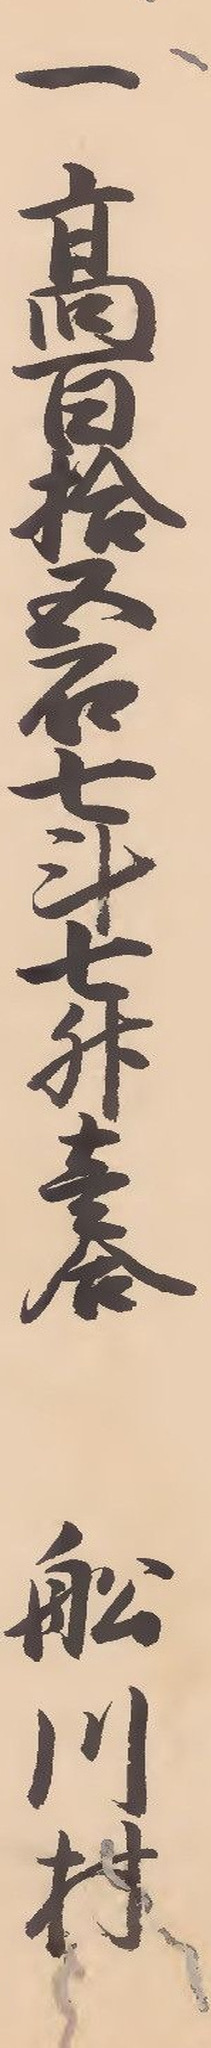一高百拾五石七斗七升壱合船川村
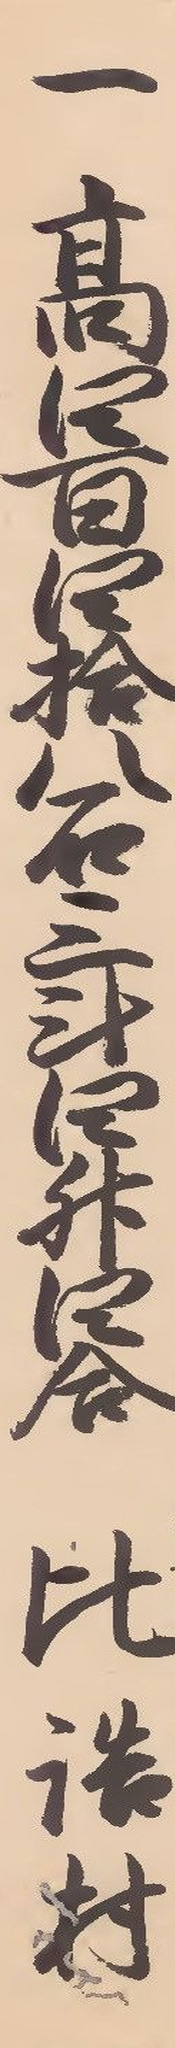一高四百四拾八石三斗四升四合比詰村
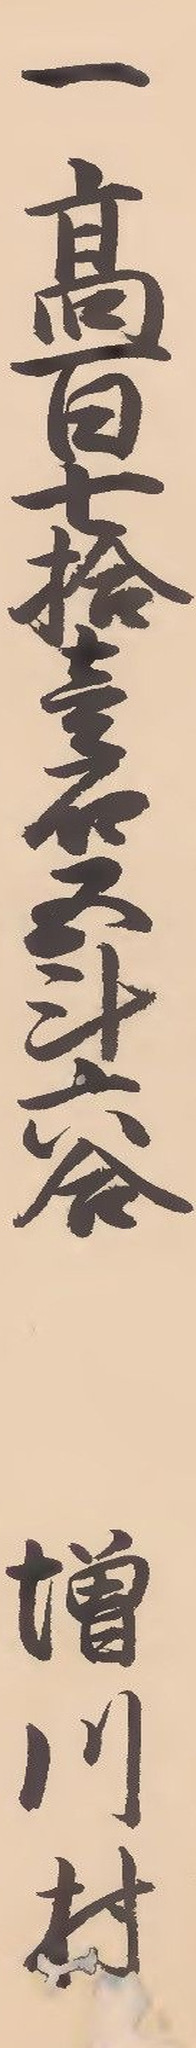一高百七拾壱石五斗六合増川村
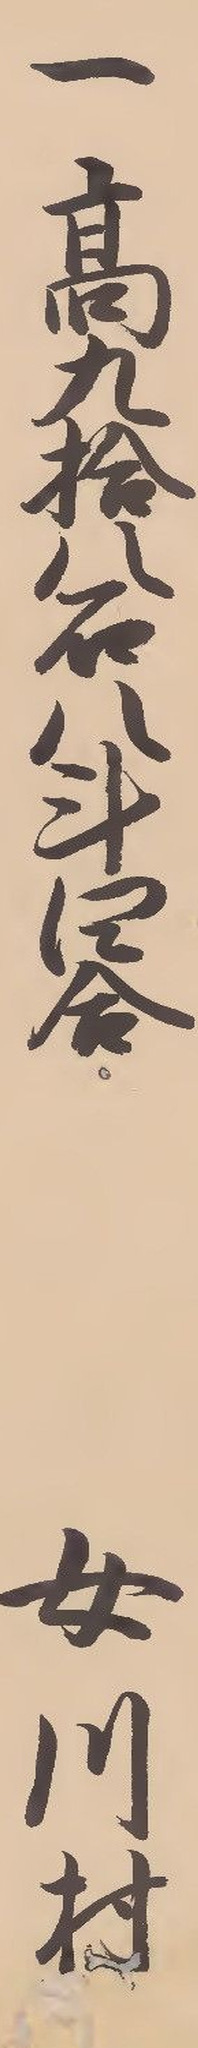一高九拾八石八斗四合女川村
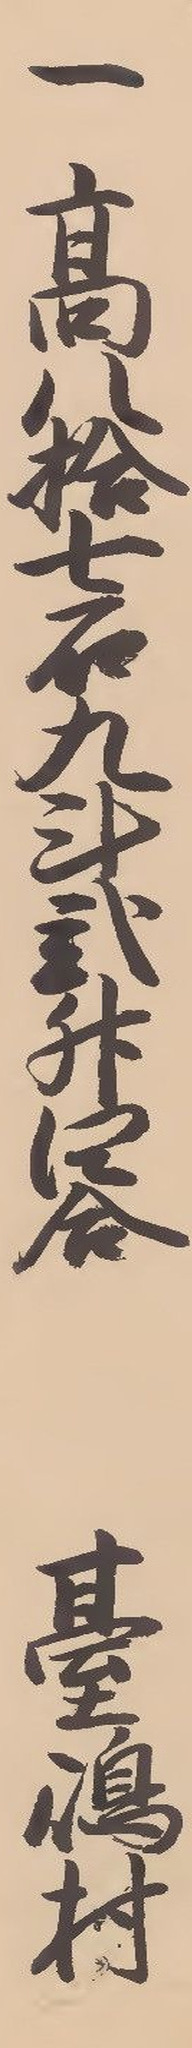一高八拾七石九斗弐升四合台島村
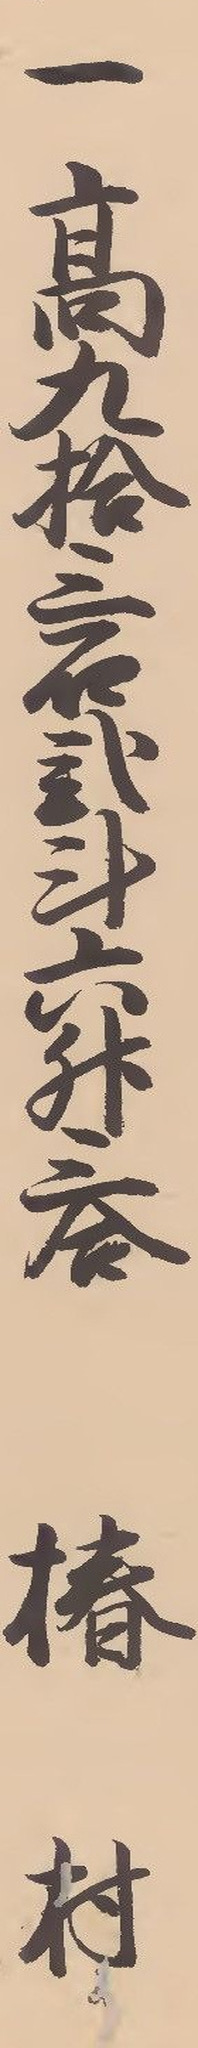一高九拾三石弐斗六升三合椿村
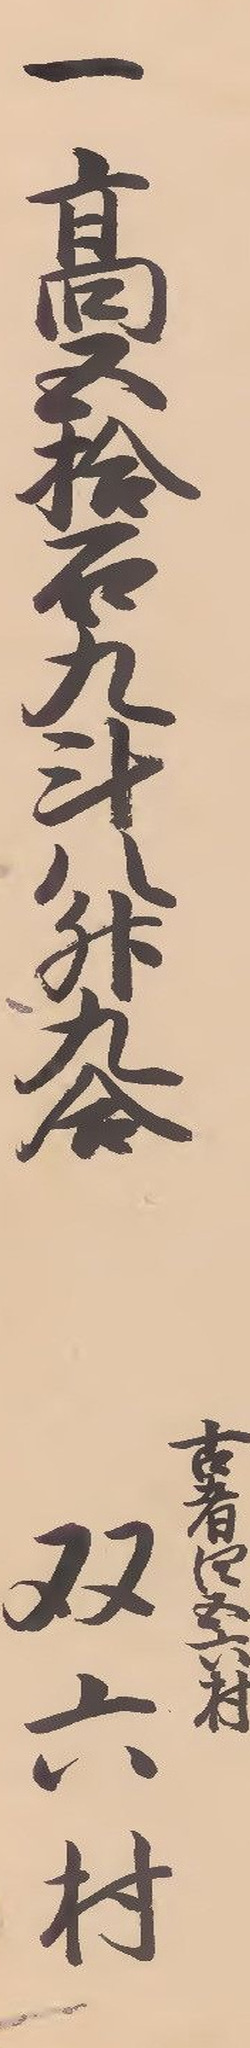一高五拾石九斗八升九合双六村

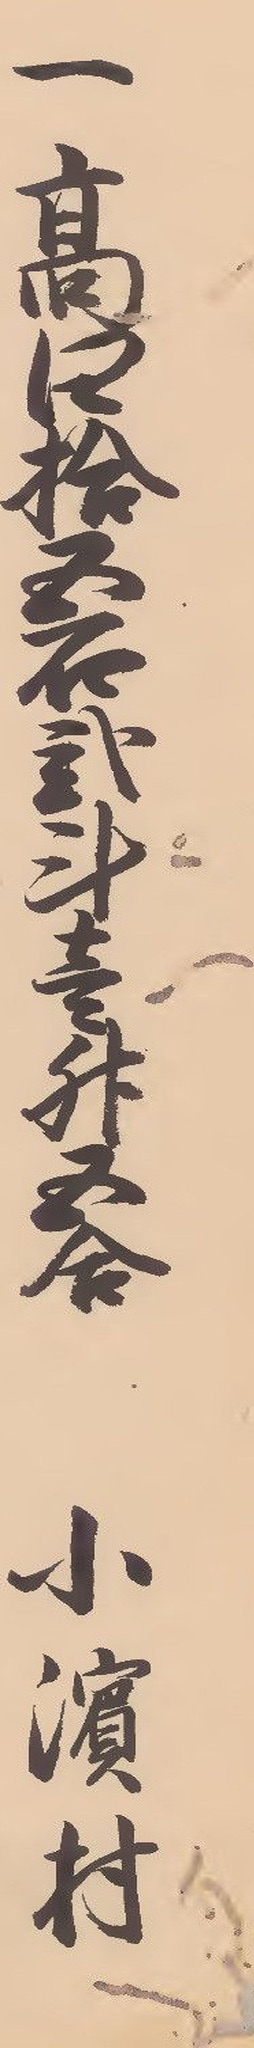一高四拾五石弐斗壱升五合小浜村
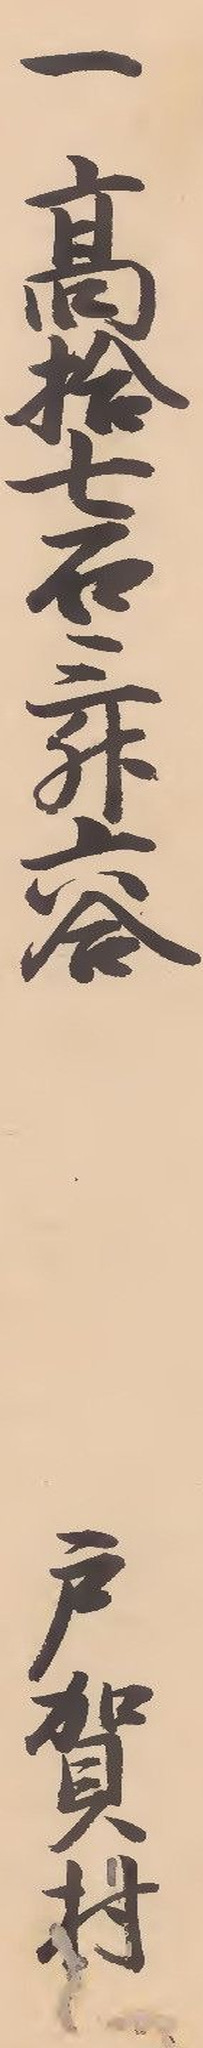一高拾七石三升六合戸賀村
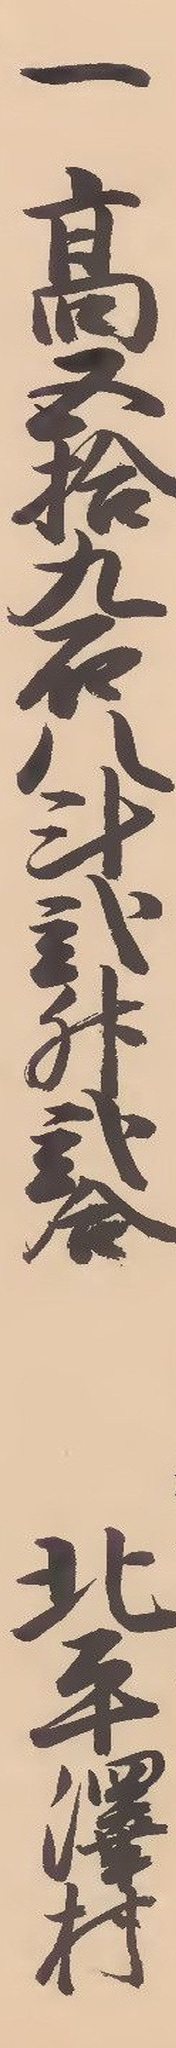一高五拾九石八斗弐升弐合北平沢村
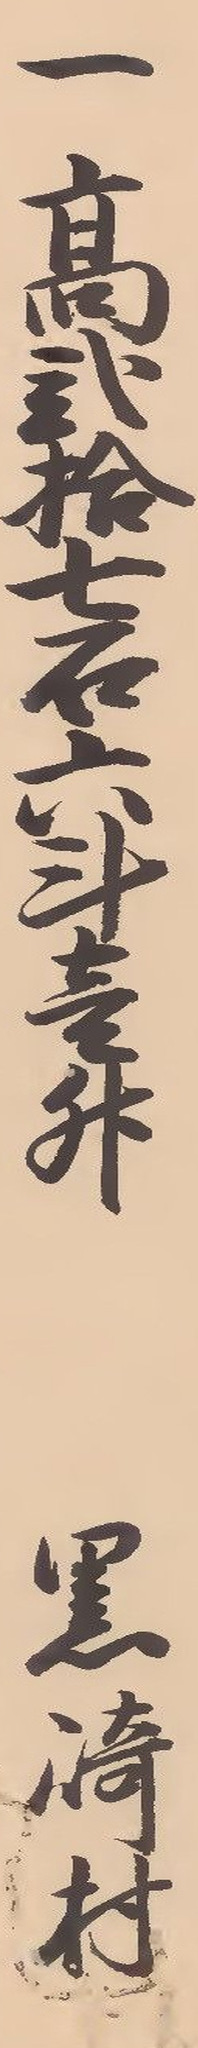一高弐拾七石六斗壱升黒崎村
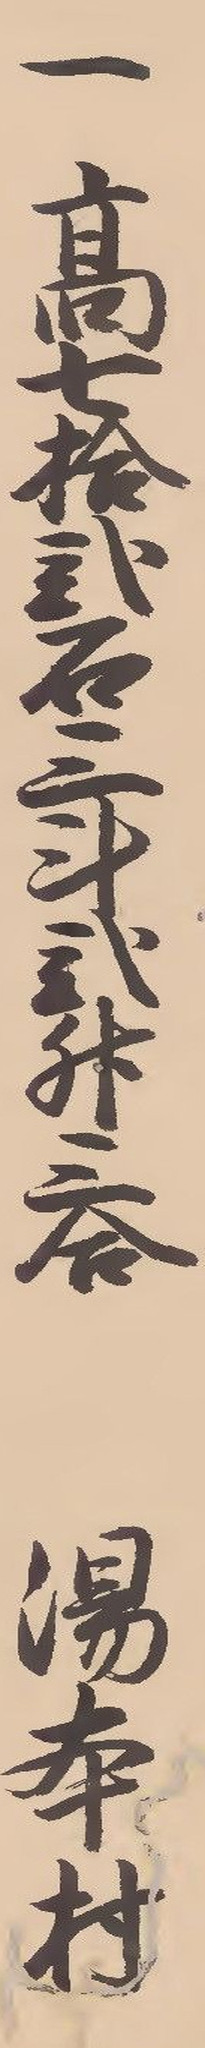一高七拾弐石三斗弐升三合湯本村
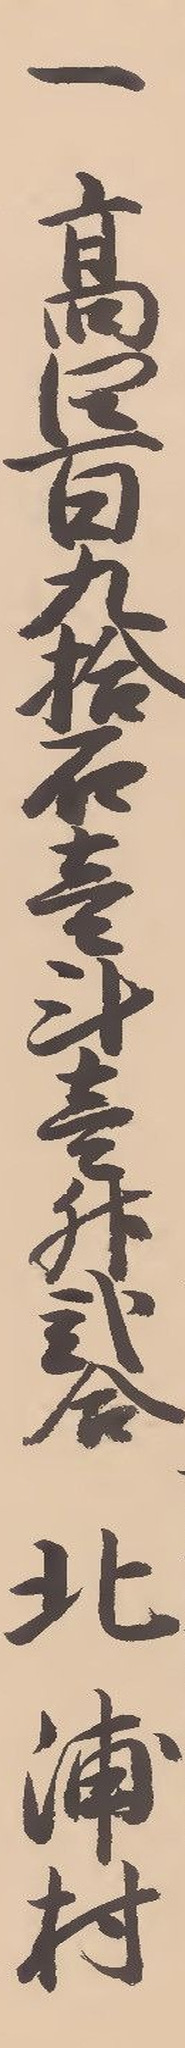一高四百九拾石壱斗壱升弐合北浦村
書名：出羽国郷帳　５
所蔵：国立公文書館 National Archives of Japan
